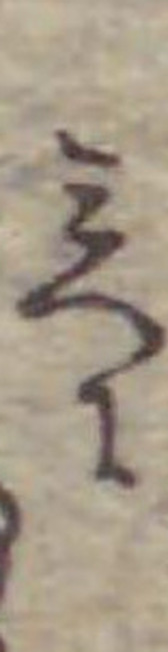みへに

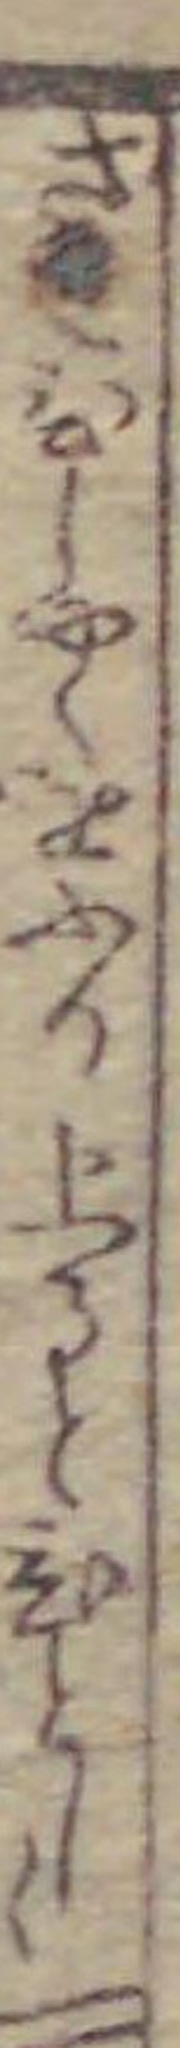さてひしやくをふり上るとひとしく
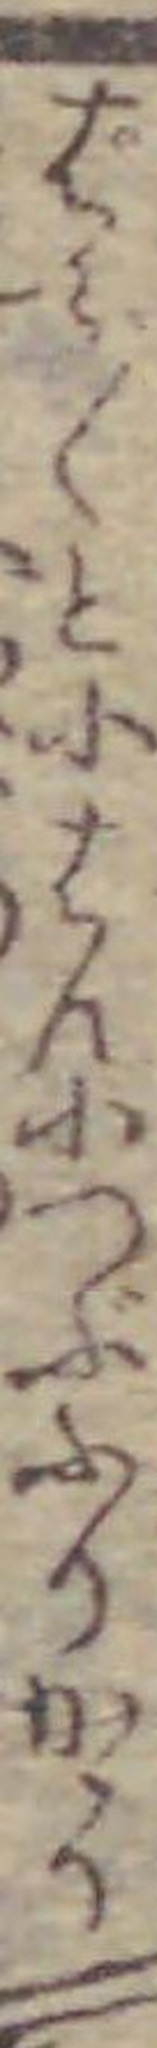ばら〳〵と小はん小つぶふりかゝり
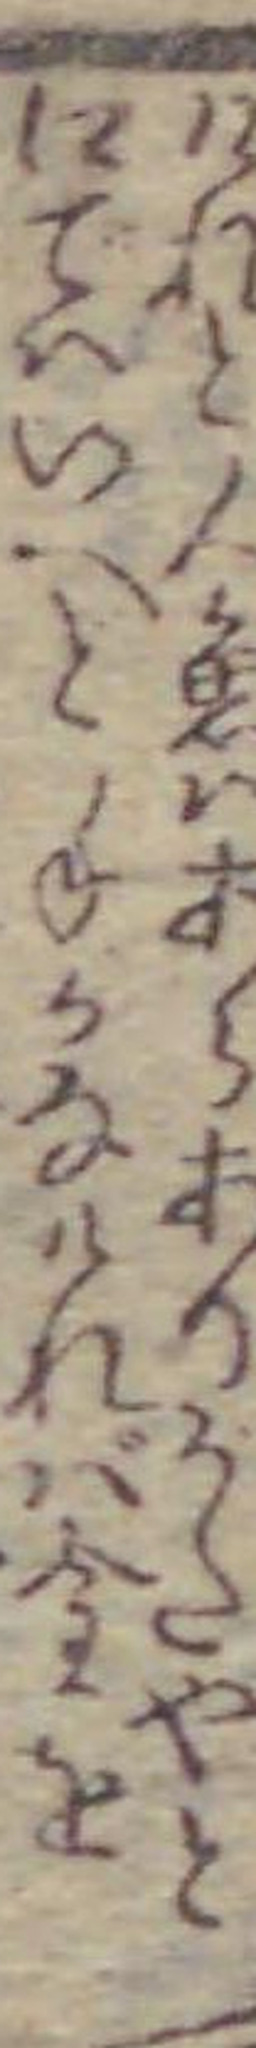口ではいへど手がなければ金を
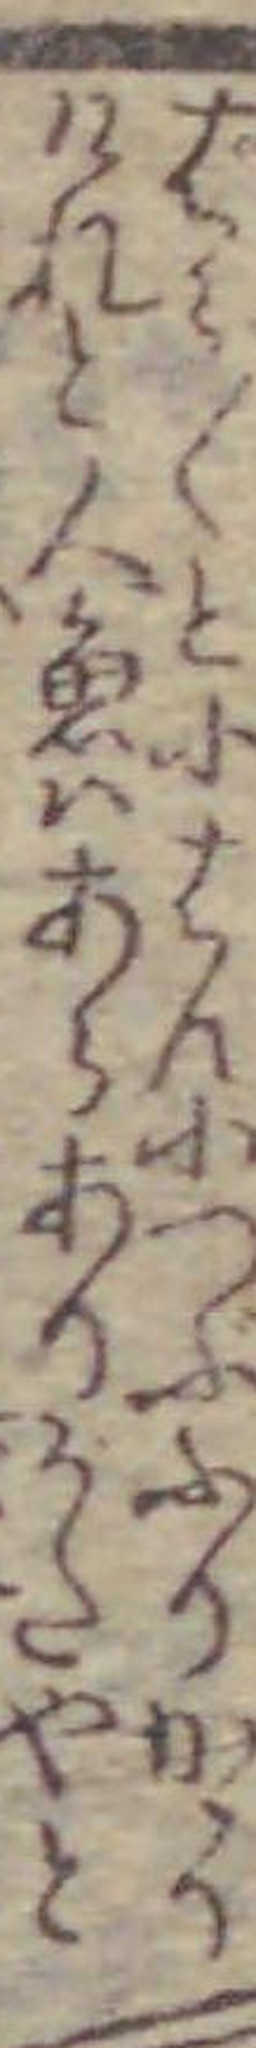けれと人魚あらありかたやと
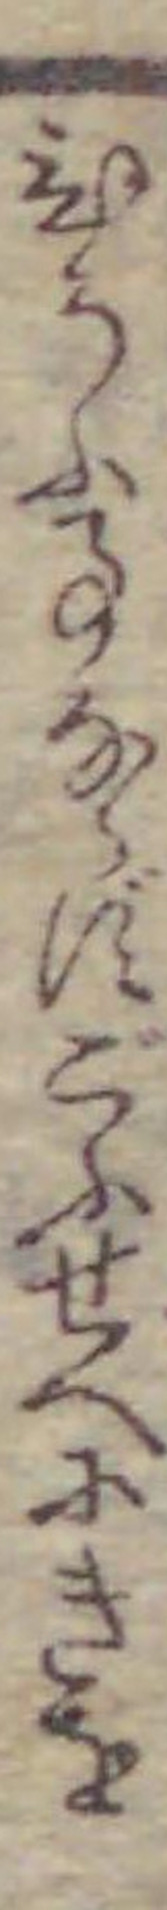ひろふ事ならずごふせへにきを
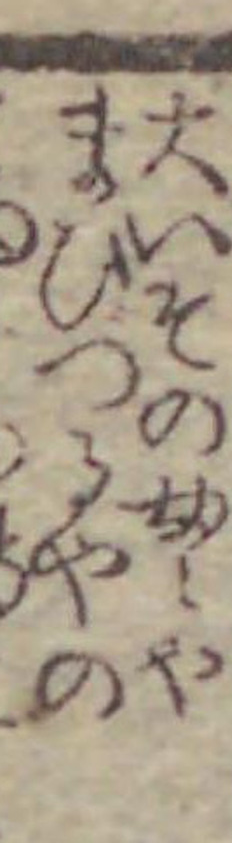まひづるやの
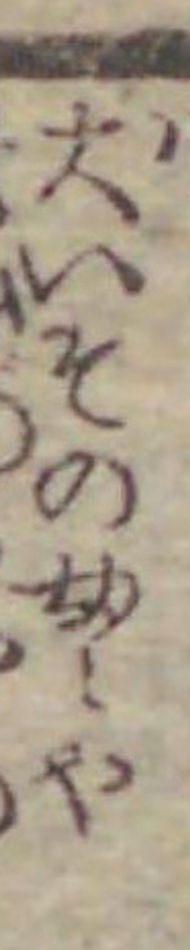大いその女郎や
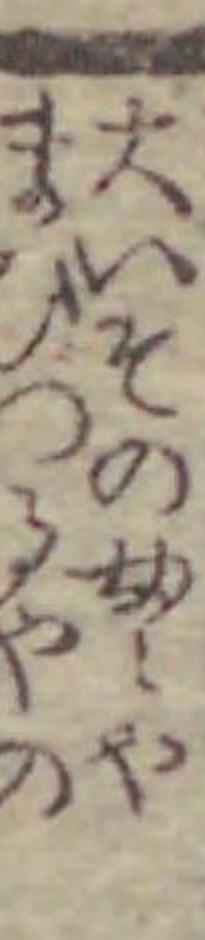まひづるやの
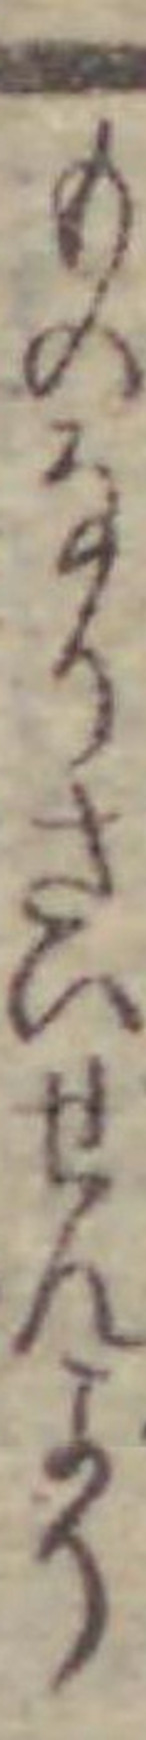ものなりさいせんより
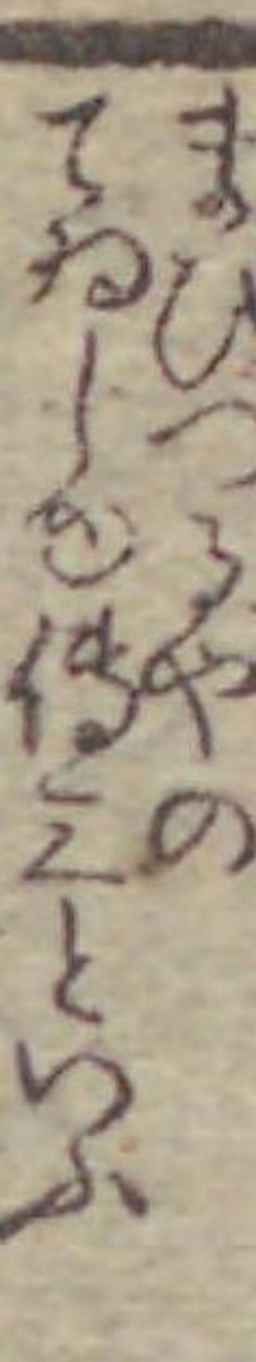てゐしゆ伝三といふ
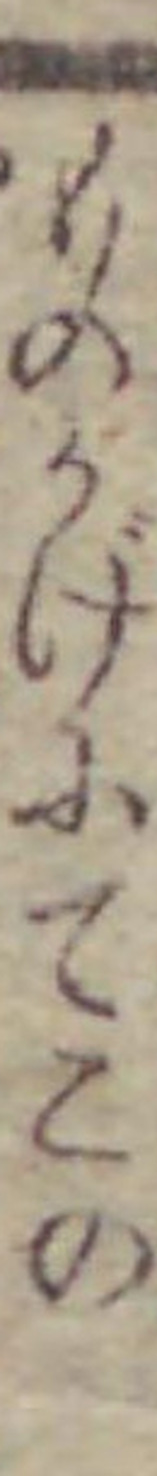ものかげにてこの
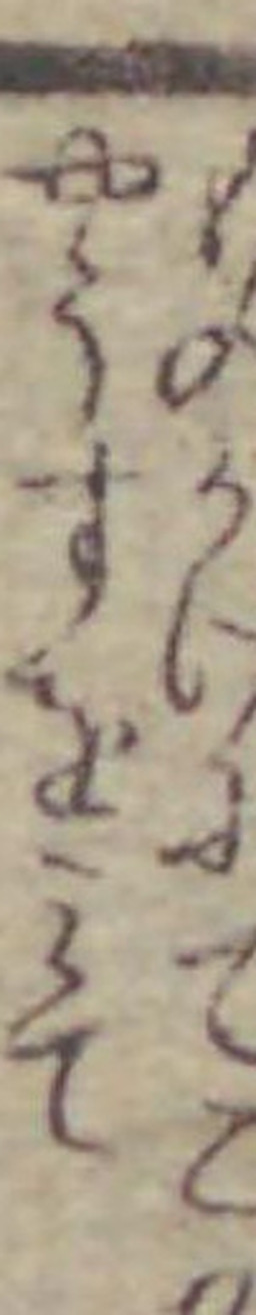やうすをみて
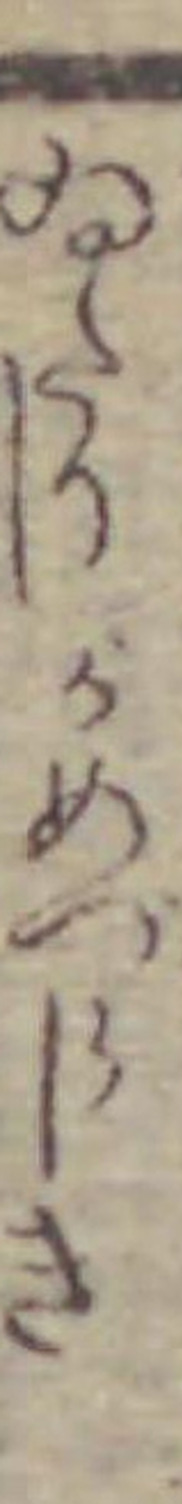ゐたりしがめづらしき
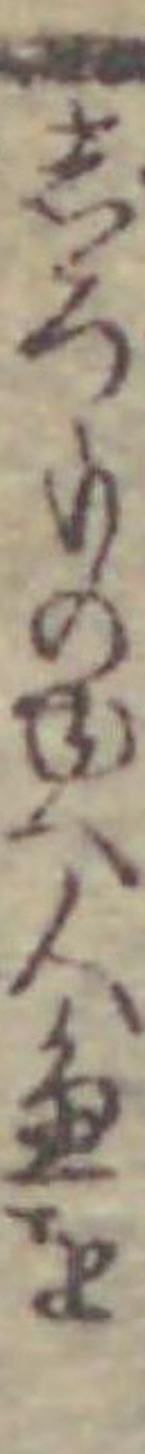しろものゆへ人魚を
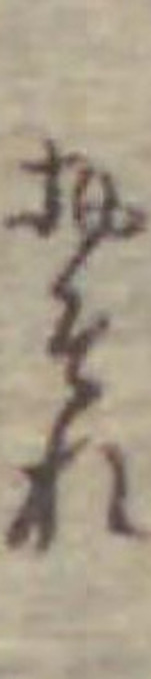おそれ
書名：箱入娘面屋人魚 3巻
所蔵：国立国会図書館 National Diet Library, JAPAN
